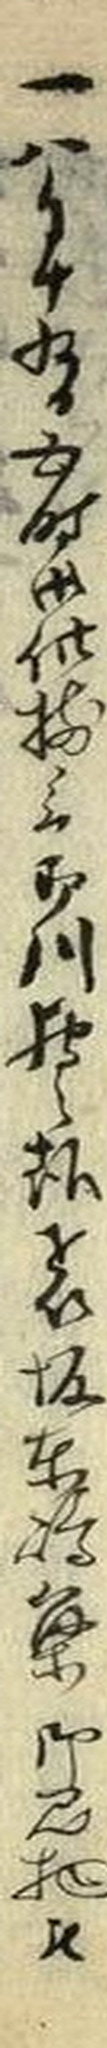一八月十九日五時御供揃ニ而御川狩之趣を以坂東嶋簗御見物被
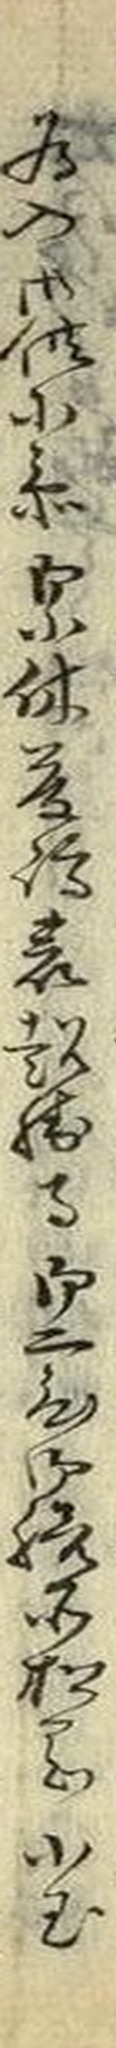為入御供小兵衛御小休藤嶋表超勝寺御二度御膳所松岡小玉
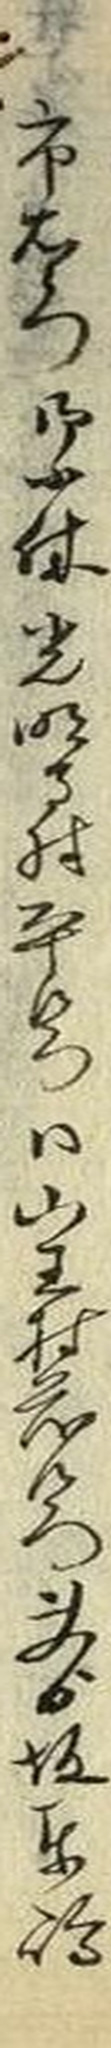市右衛門御小休光明寺村平左衛門同山王村茂左衛門夫ゟ坂東嶋
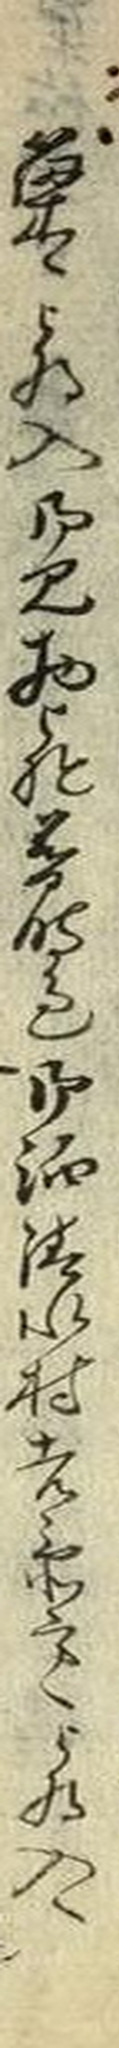簗へ被為入御見物被遊暮時過御泊清水村吉兵衛方へ被為入候
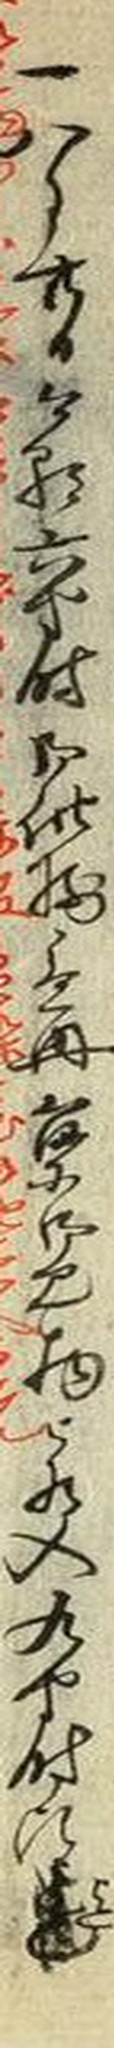一八月廿日今朝六半時御供揃ニ而再簗御見物被為入九半時頃迄
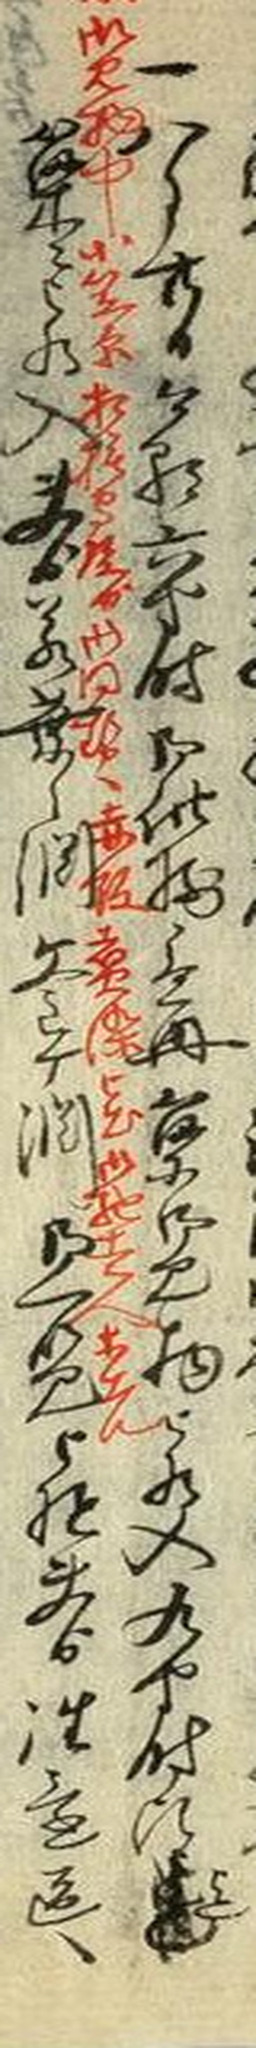簗ニ被為入夫ゟ若葉之淵釜ケ淵御一覧被遊夫ゟ往還道へ
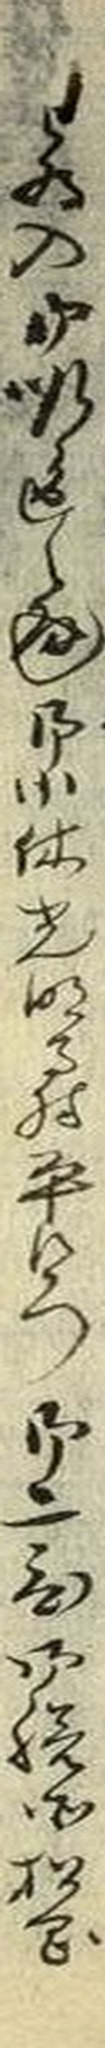被為入御順道之通御小休光明寺村平左衛門御二度御膳所松岡
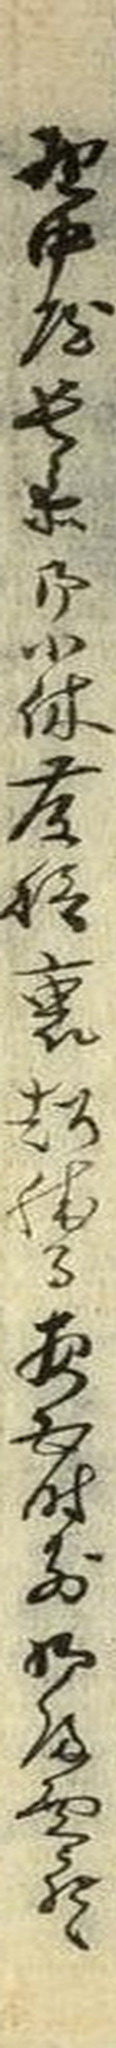野中屋長兵衛御小休藤嶋裏超勝寺夜五時前御帰殿被遊候
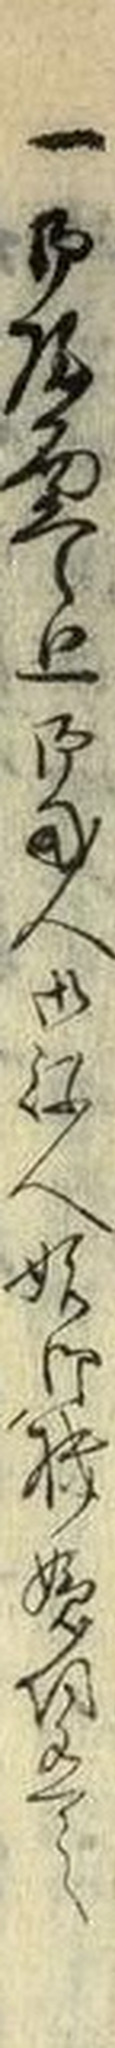一御帰殿之上御用人御役人始御機嫌伺有之
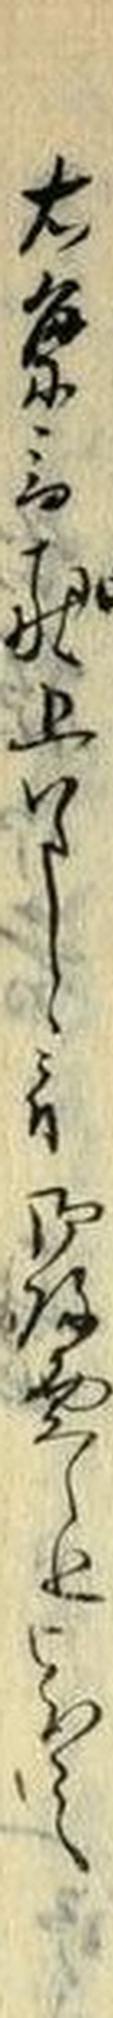右簗ニ而献上いたし候ニ付御帰殿之上被下之
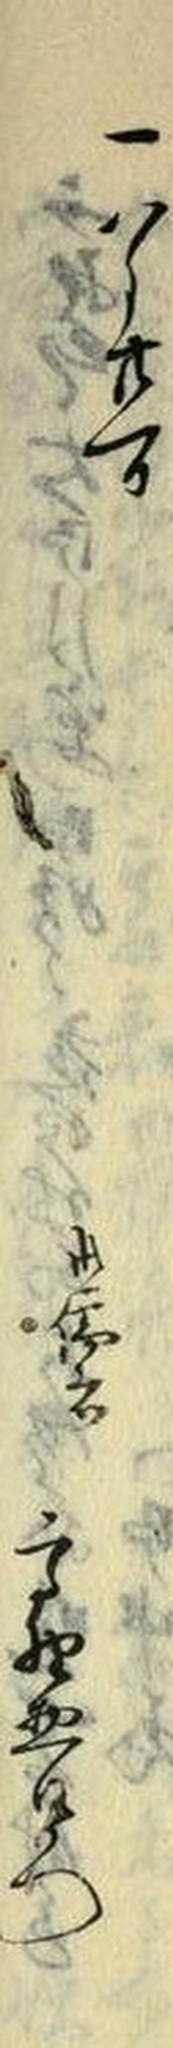一八月廿一日御儒者高野惣左衛門
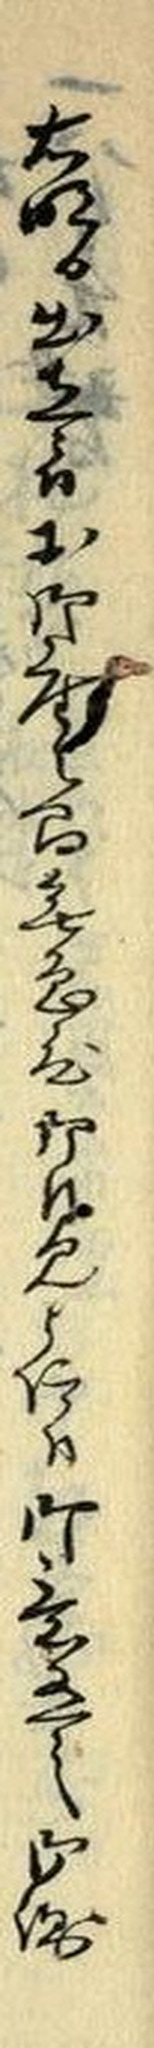右明日出立ニ付於御座之間無急度御目見被仰付御意有之御側
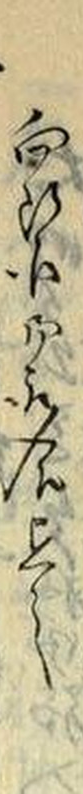向頭取御取合申上之
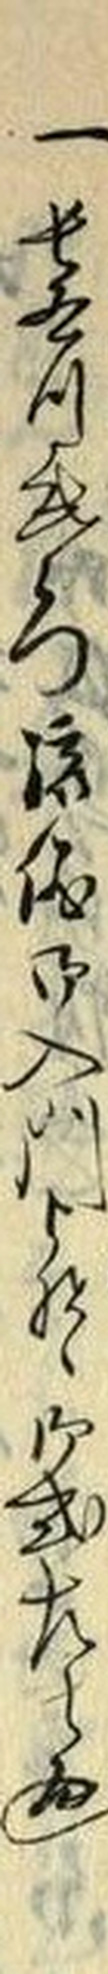一長谷川武右衛門流儀御入門被遊候御式左之通
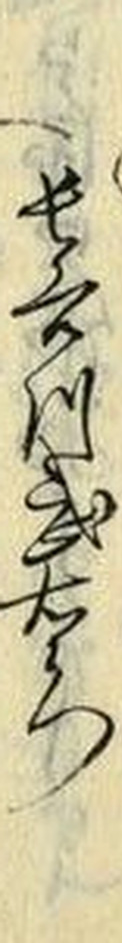長谷川武右衛門
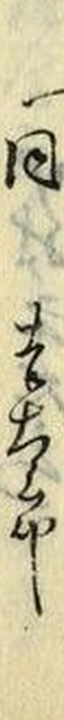同吉太郎
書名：少傅日録抄（斉承付側向頭取日記、在国）
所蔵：福井県文書館 Fukui Prefectural Archives
